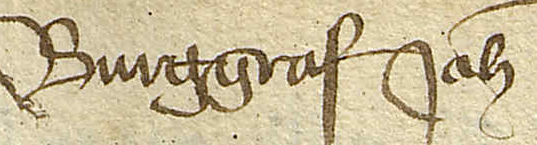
Burggraf Ioh*
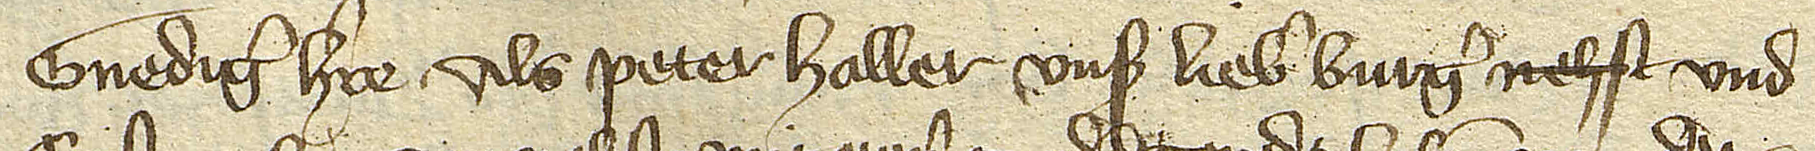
Gnedig* h*re / Als Peter haller vnſ* lieb* burg* nehſt vnd
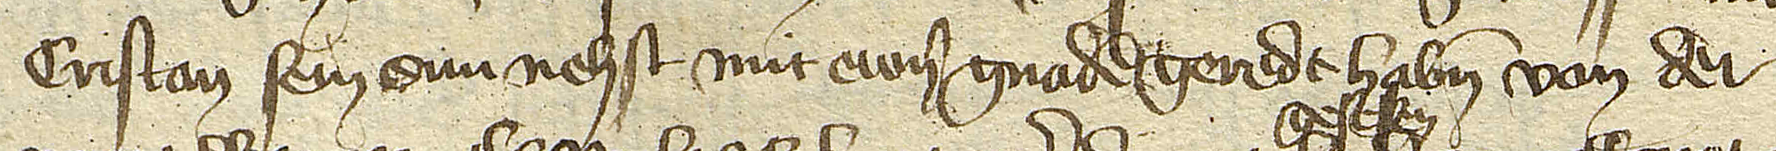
Criſtan ſein Sun nehſt mit ewn* gnad* geredt habn* von der
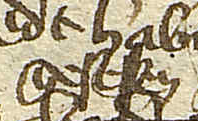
geſeſſen
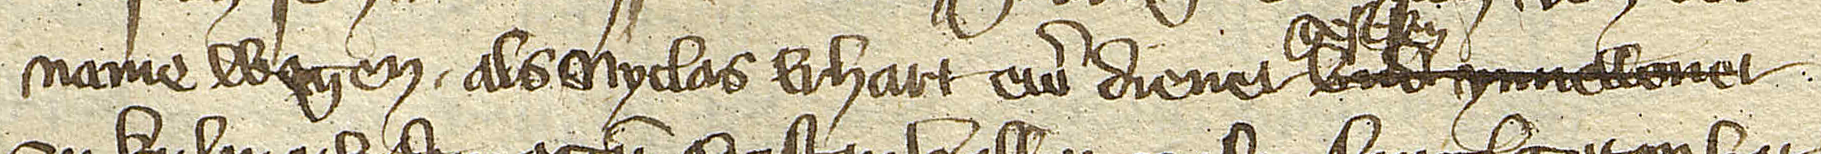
name wegen / als Nyclas Erhart ew* diener vnd ynnewonet
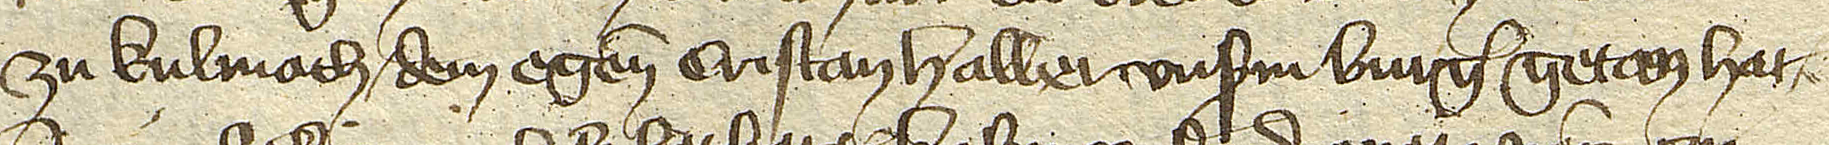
cʒu kulmach / dem egen* Criſtan haller vnſ*m burg* getan hat
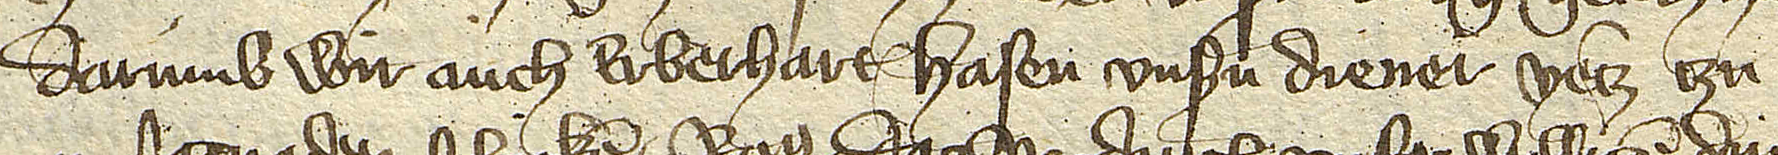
Darümb wir auch Erberhart* haſen vnſ*n diener yecʒ* cʒu
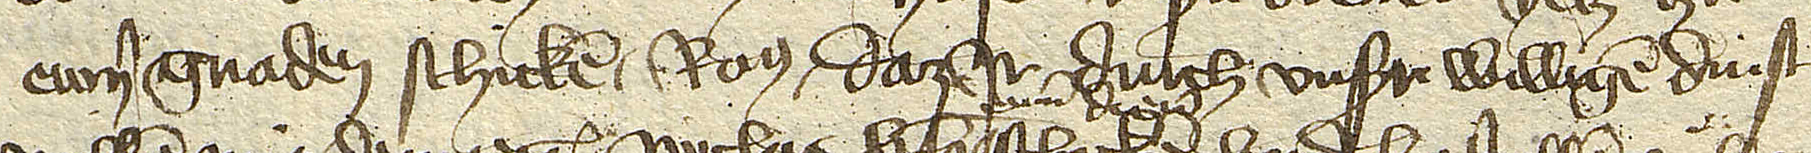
ewn* gnaden ſchicke* / Ro* / daʒ Ir durch vnſ*r willige* dinſt
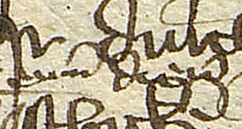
ewm* dien*
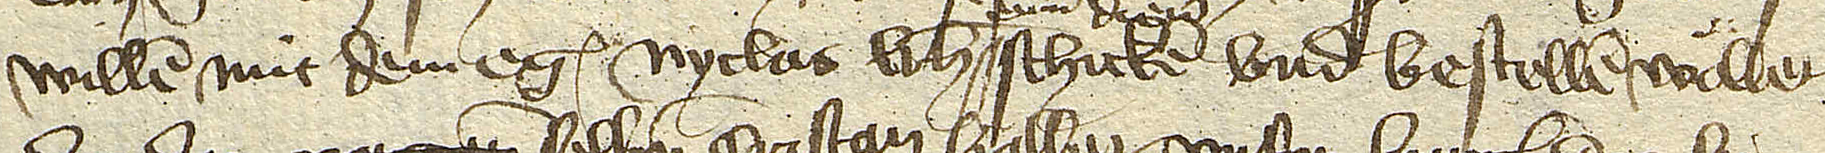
wille* mit dem eg* Nyclas Erh* ſchick* vnd beſtelle* wöllet
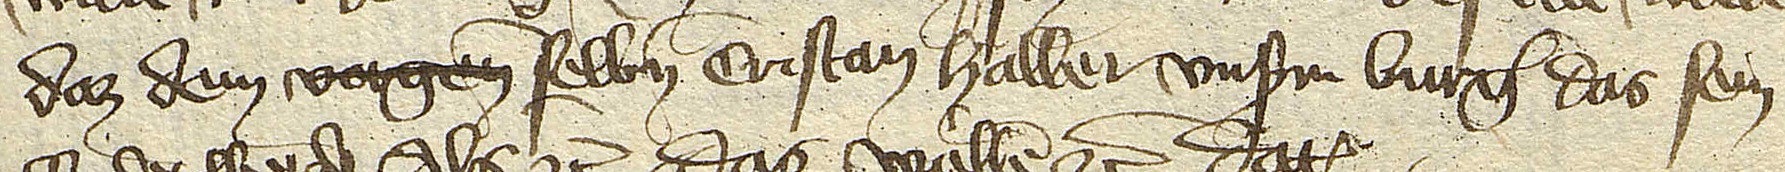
daʒ dem vorgen ſelbn* Criſtan haller vnſ*m burg* das ſein
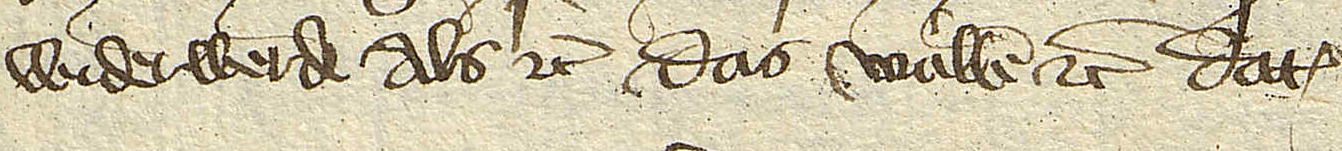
wider werde Als ec* / das wölle ec* dat*
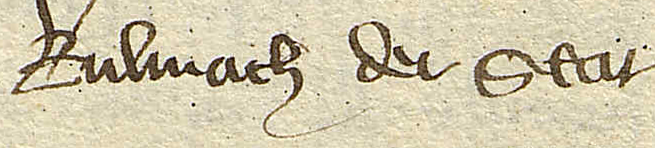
Kulmach der Stat
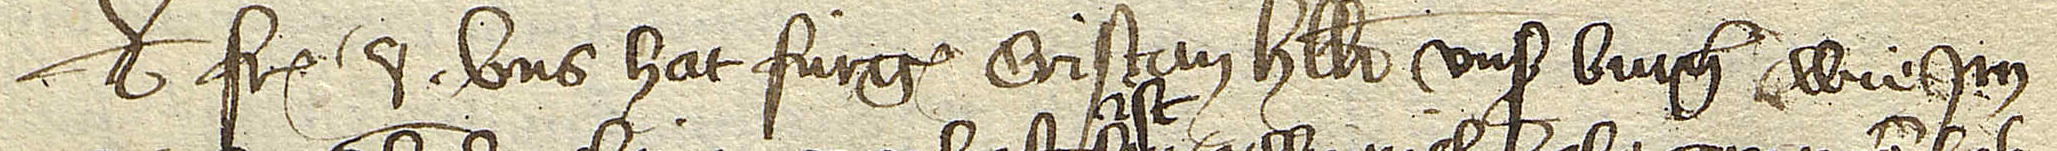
L* fr* / A . vns hat fürg* Criſtan hll* vnſ* burg* / wie Im
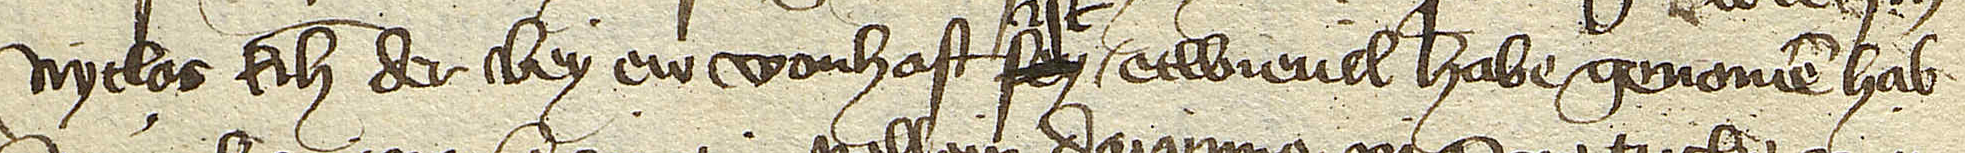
Nyclas Erh* der / bey ew wonhaft ſey / etwieuil habe genome* hab
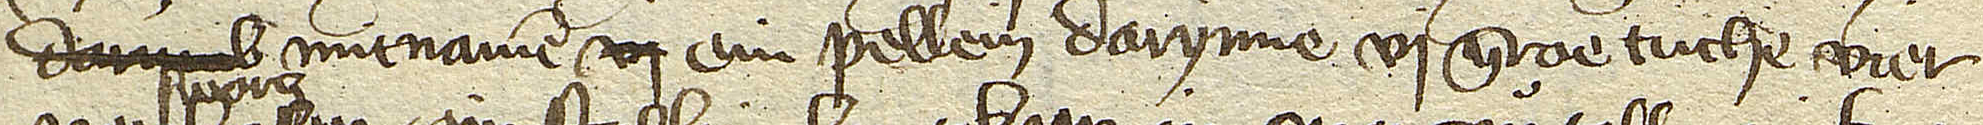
darümb mitname* vi* ein pellein darynne vi* groe tuche vier
